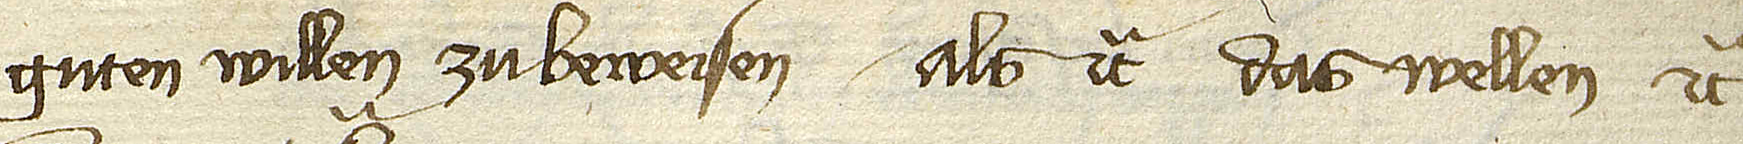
guten willen ʒu beweiſen / als ec* das wellen ec*
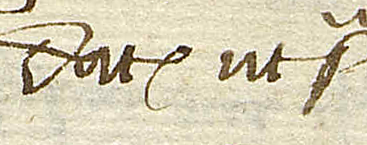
Dat* ut ſ*
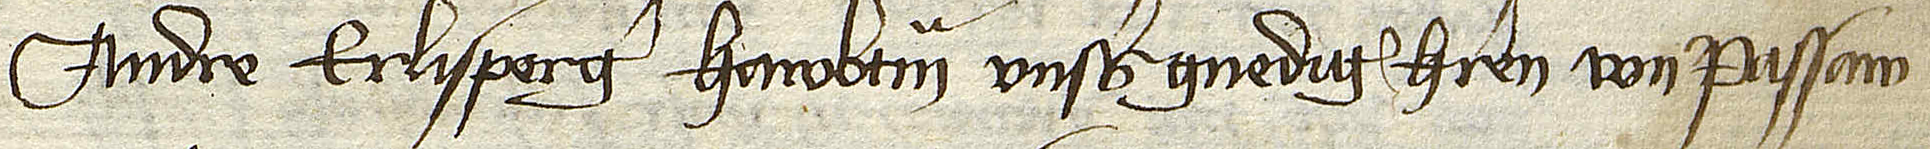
Andre Erliſperg* hawbtm* vnſ*s gnedig* h*ren von Paſſaw
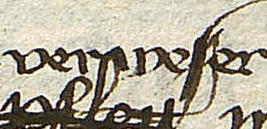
verweſer
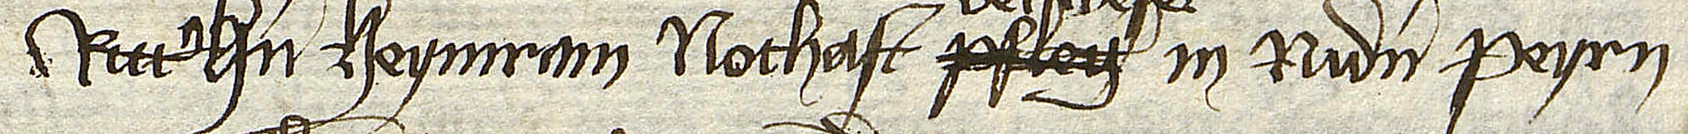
Ritt* H*n Heymram Nothaſt pfleg* in Nid*n Peyrn
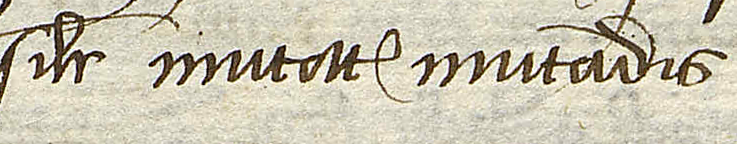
ſilr* mutat* muta*dis
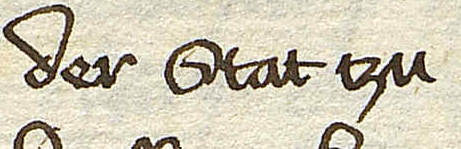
der Stat cʒu
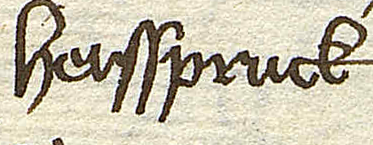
Herſſpruck
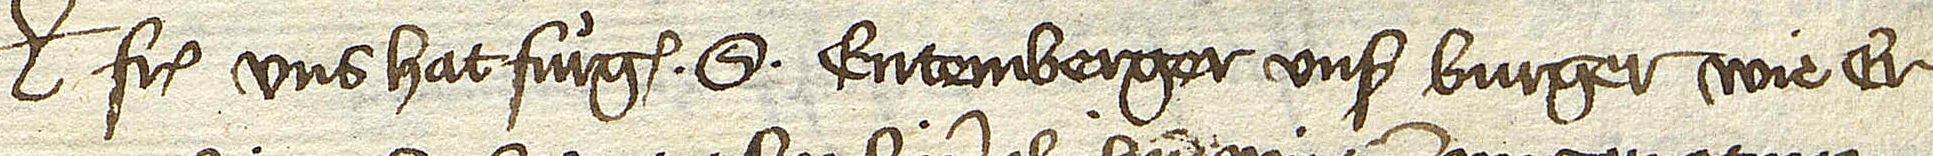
L* fr* vns hat fürg* . S . Entemberger vnſ* burger wie Er
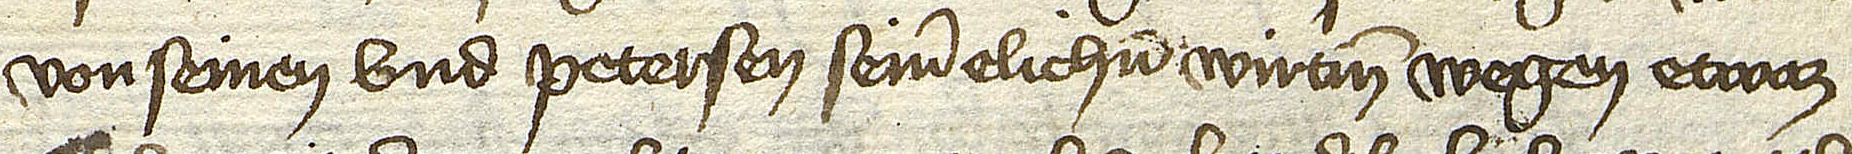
von ſeinen vnd peterſen ſein* elich*n wirtin* wegen etwaʒ
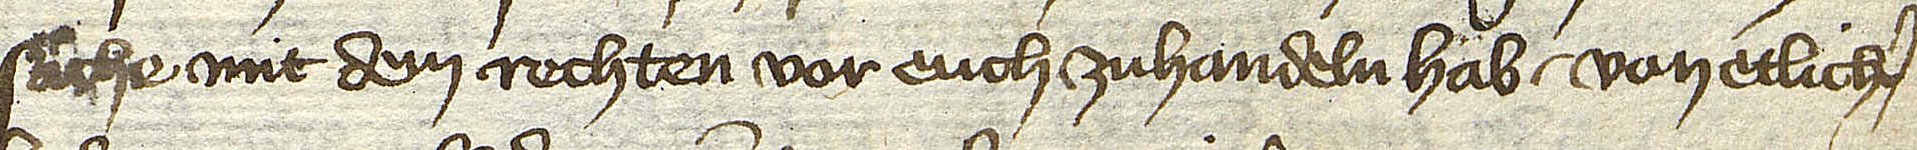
ſache mit dem rechten vor euch cʒuhandeln hab / von etlich*
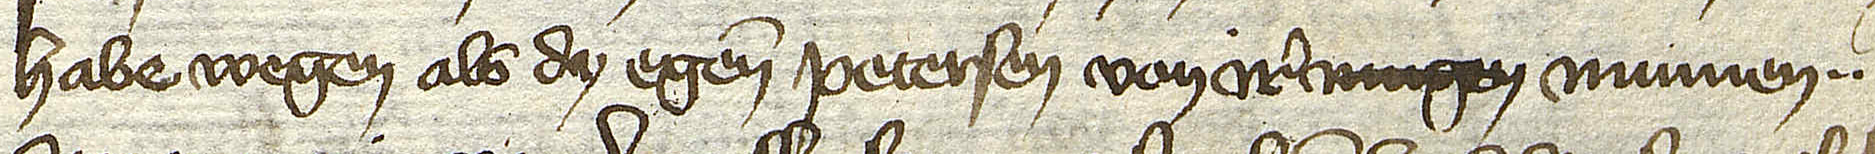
habe wegen als dy egen* peterſen von ir* mugen mumen ~
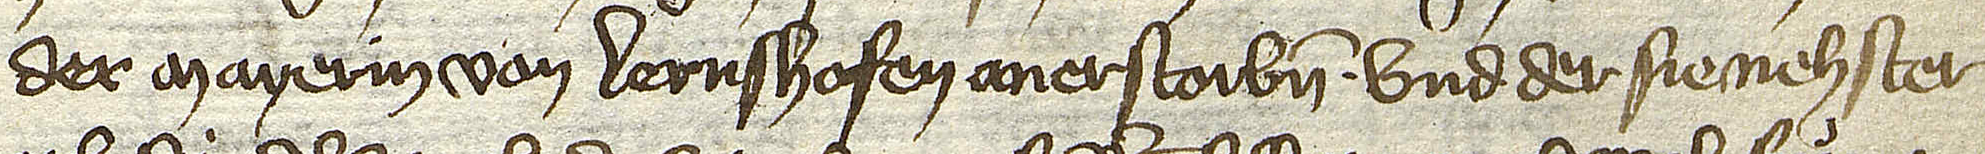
der Mayerin von lernſhofen anerſtorb*n . vnd der ſie nehſter
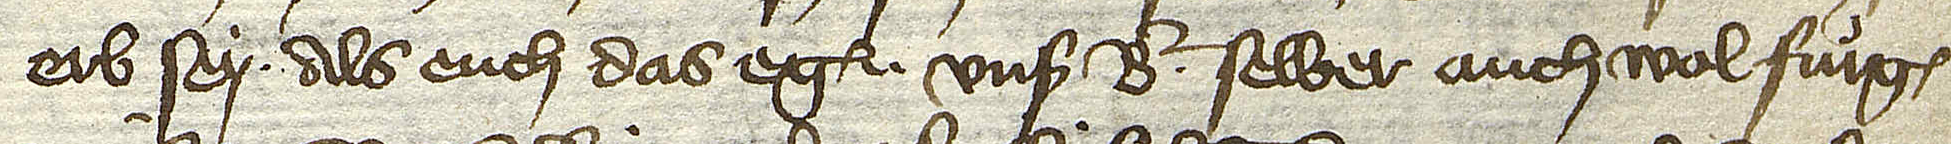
erb ſey . Als euch das eg* ~ vnſ* B* . ſelber auch wol fürg*
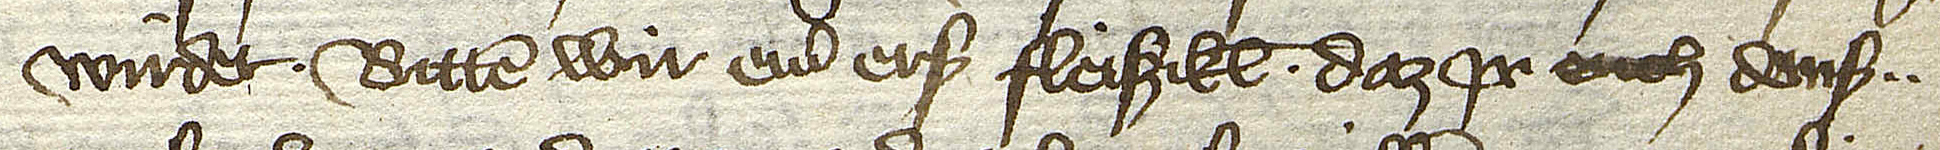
wirdet . Bitte* wir ew* erſ* fleiſʒikl* . daʒ Ir euch demſ* ~
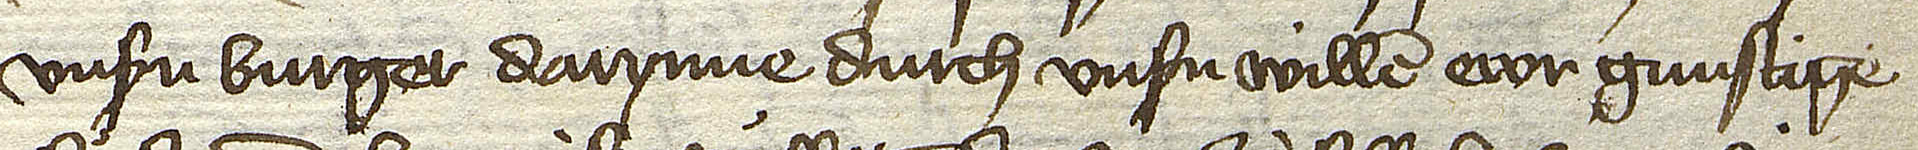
vnſ*n burger darynne durch vnſ*n wille* ewr gunſtige
